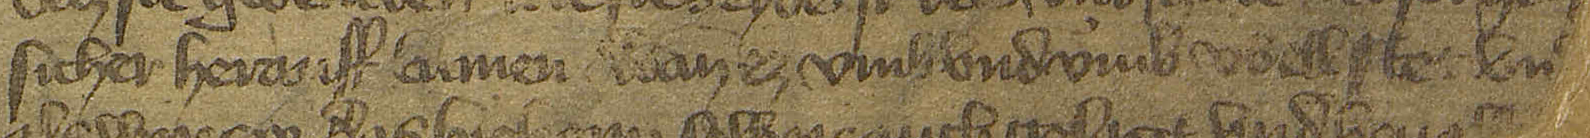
ſicher herauff kumen / wan* eʒ vmb vnd mb %%%%%%% vnd %%%%%%
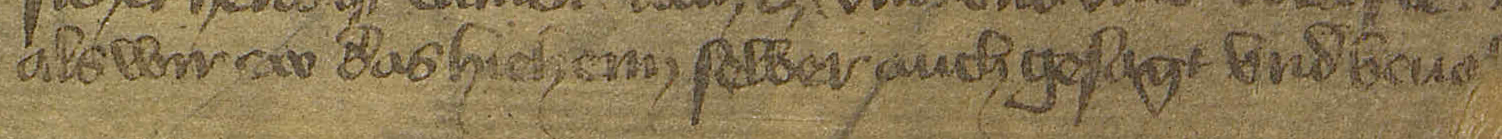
als wir ew das hieheim ſelber auch geſagt vnd beuol%%%%%% %%%%%
